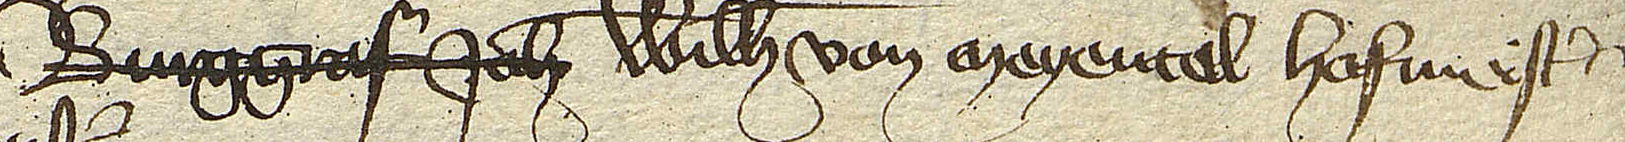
Burggraf Ioh* Wilh* von Meyental hofmeiſt*
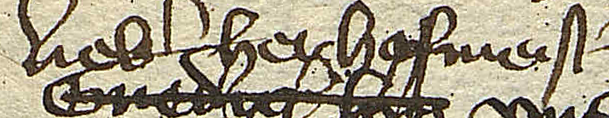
lieb* her hofmeiſt*
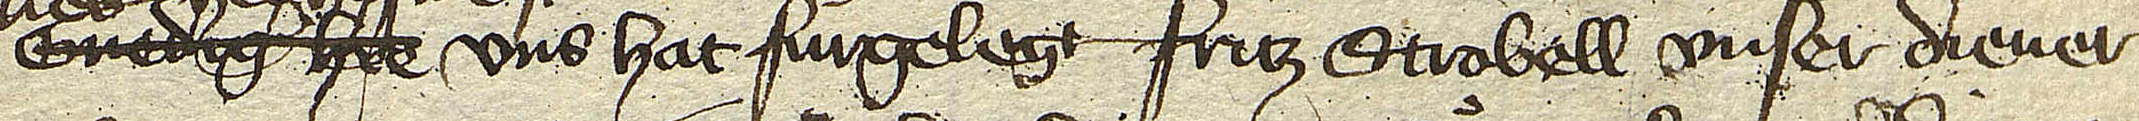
Gnedig* h*re vns hat fürgelegt fricʒ Strobell vnſer diener
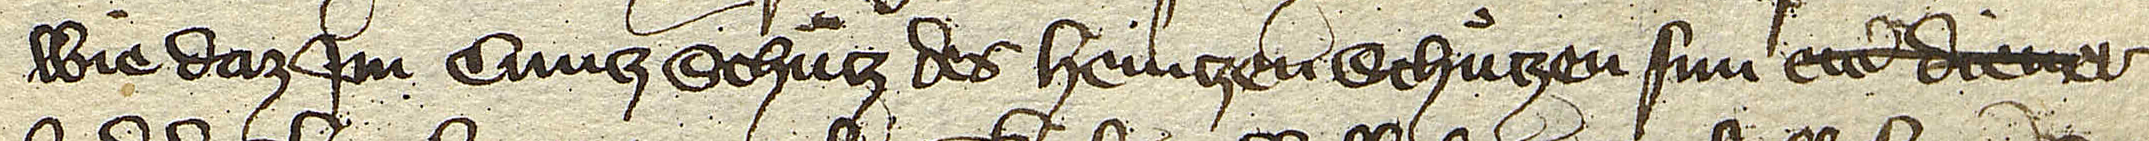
wie daʒ Im Cuncʒ Schücʒ des heincʒen Schücʒen ſun ew* diener
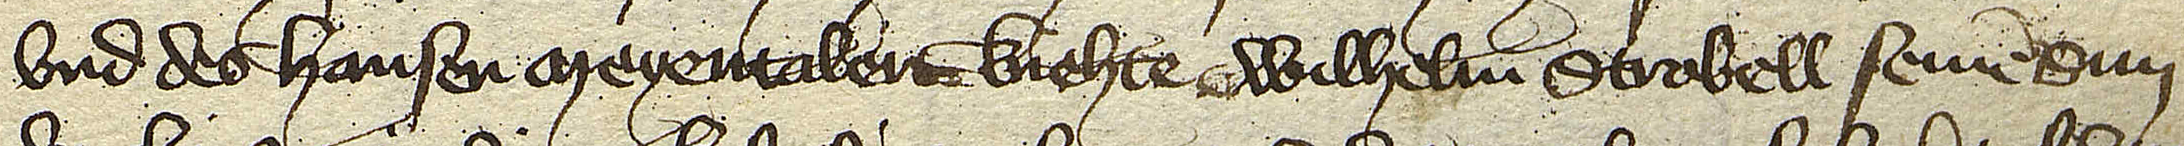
vnd des hanſen Meyentalers knehte / wilhelm Strobell ſeine* Sun
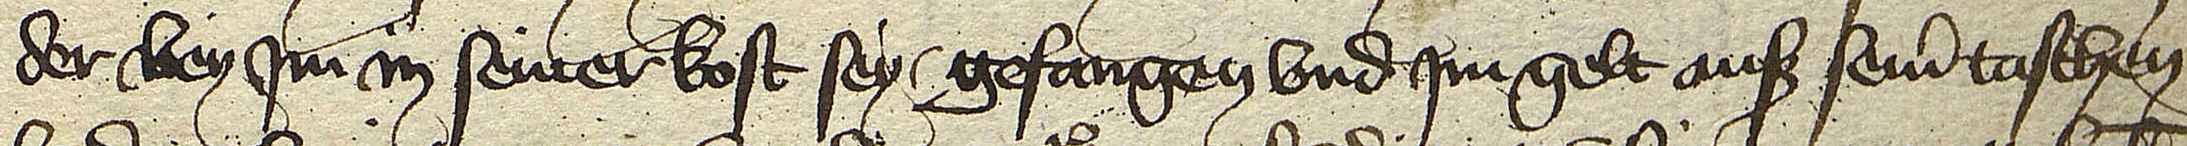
der / bey Im in ſeiner koſt ſey / gefangen vnd Im gelt auſʒ ſein* taſchen
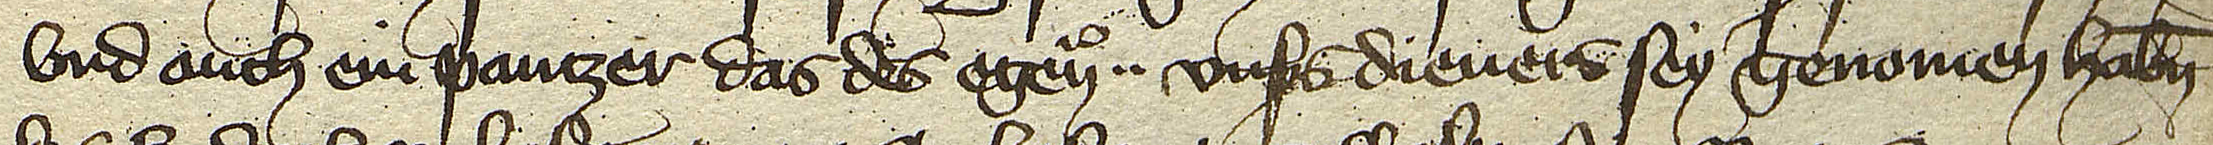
vnd auch ein pancʒer das des egen* ~ vnſ*s dieners ſey genomen habn*
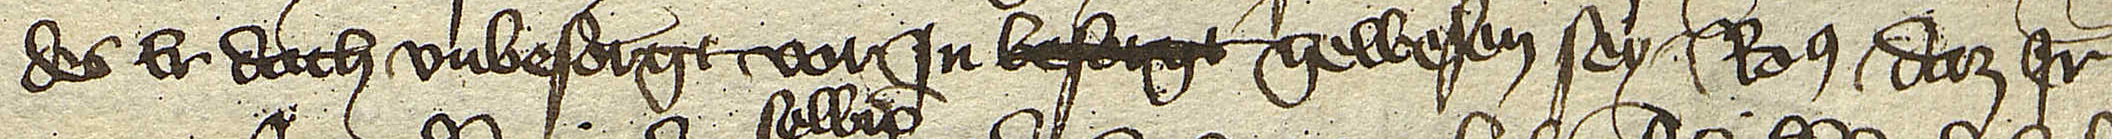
des Er doch vnbeſorgt vor In beſorgt geweſen ſey / Ro* / daʒ Ir
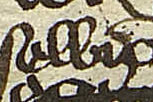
ſelbn*
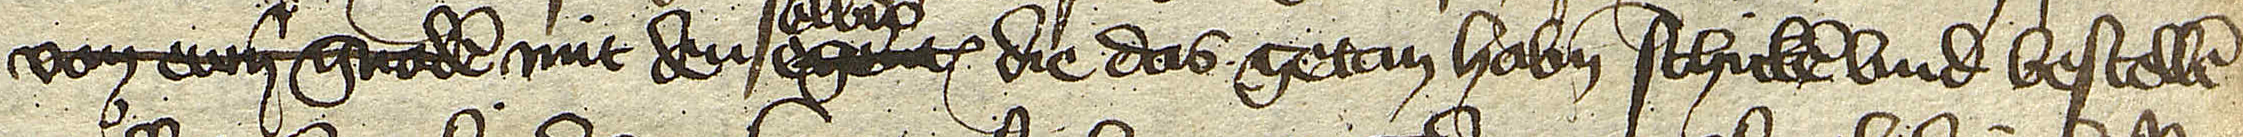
von ewm* gnade* mit den egent* die das getan habn* ſchicke* vnd beſtelle*
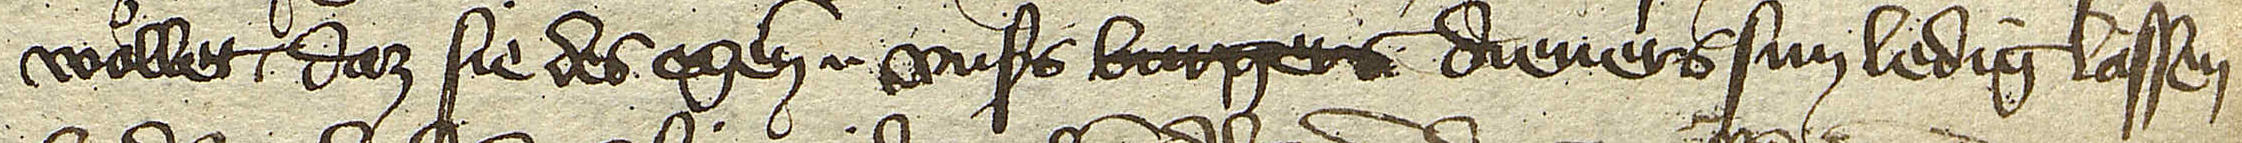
wöllet / daʒ ſie des egen* ~ vnſ*s burgers dieners ſun ledig laſſen
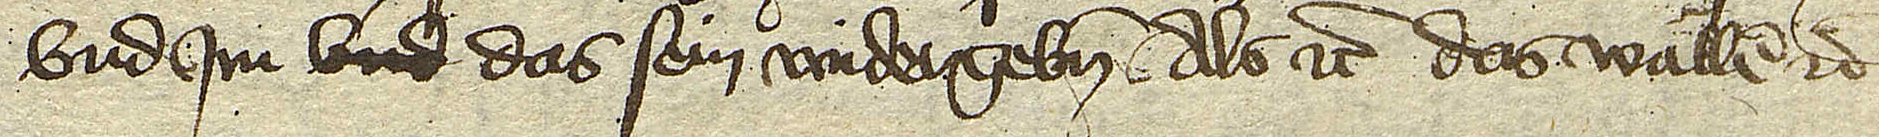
vnd Im vnd das ſein widergebn* / Als ec* das wölle* ec*
